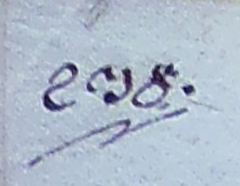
238.
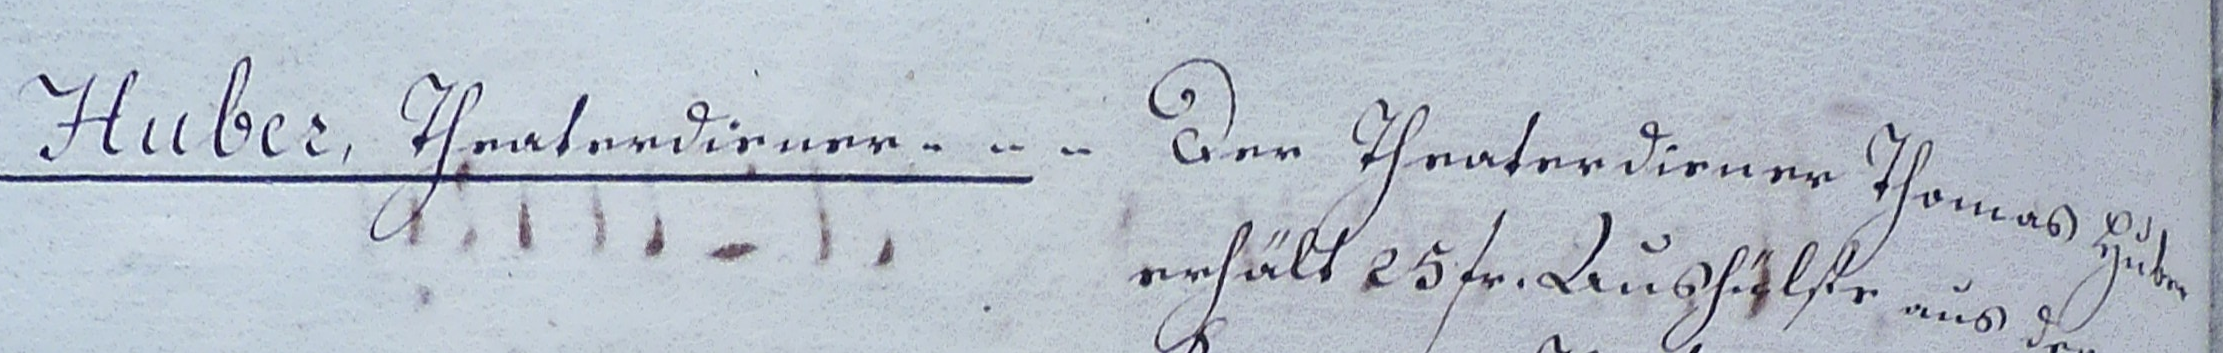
Huber, Theaterdiener .. .. .. Der Theaterdiener Thomas Huber
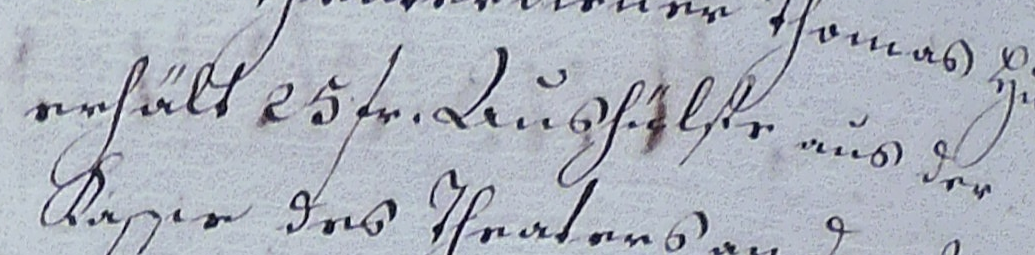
erhält 25fr. Aushülfe aus der
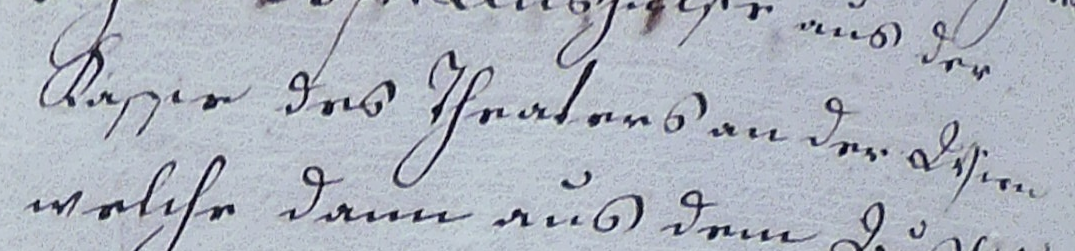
Kasse des Theaters an der Wien
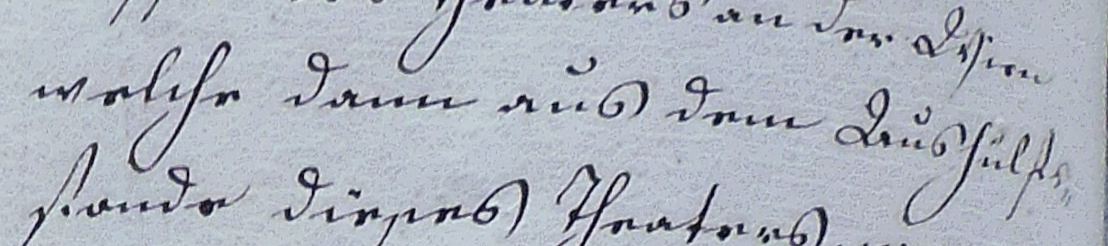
welche dann aus dem Aushülfs¬
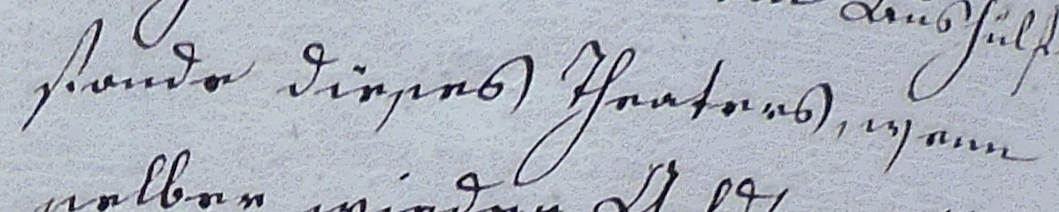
fonde dieses Theaters, wenn
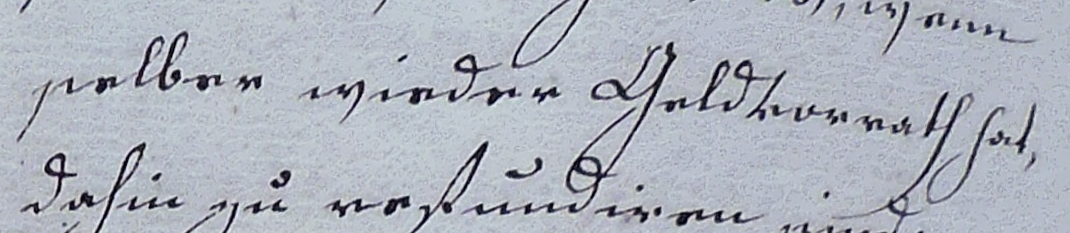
selber wieder Geldvorrath hat,
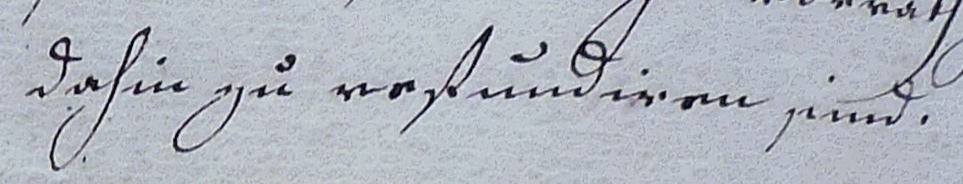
dahin zu refundiren sind.
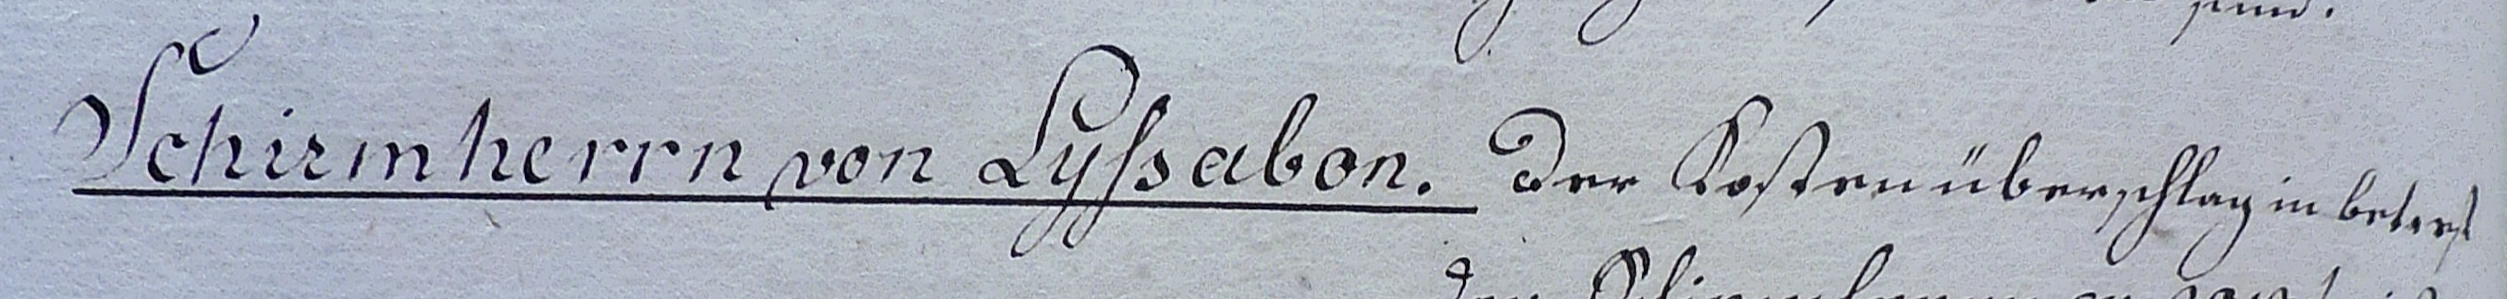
Schirmherrn von Lyssabon. Der Kostenüberschlag in betref
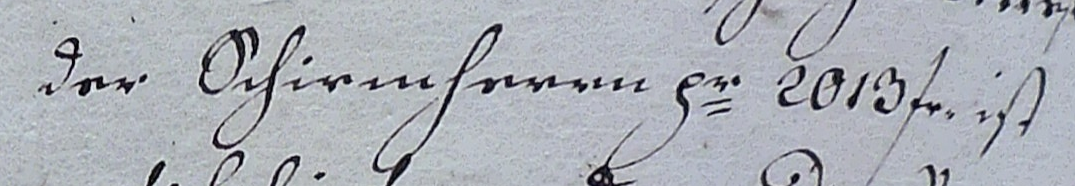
der Schirmherrn pr͇ 2013fr. ist
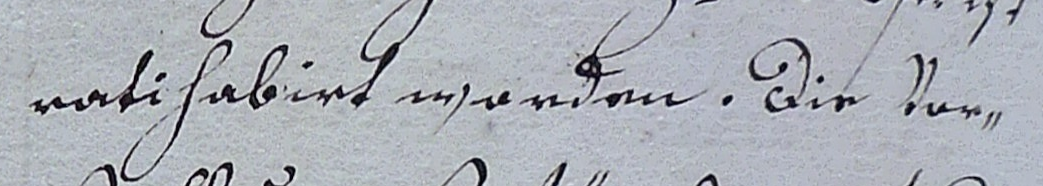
ratihabirt worden. Die Vor¬
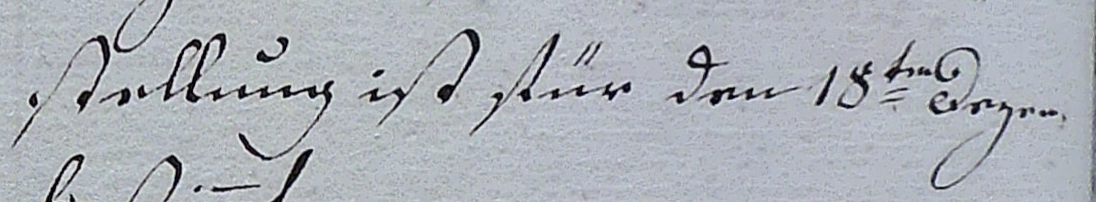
stellung ist für den 18te͇n Dezem.
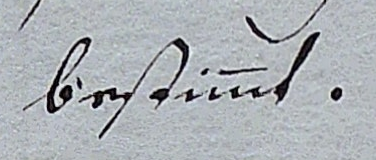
bestim̅t.
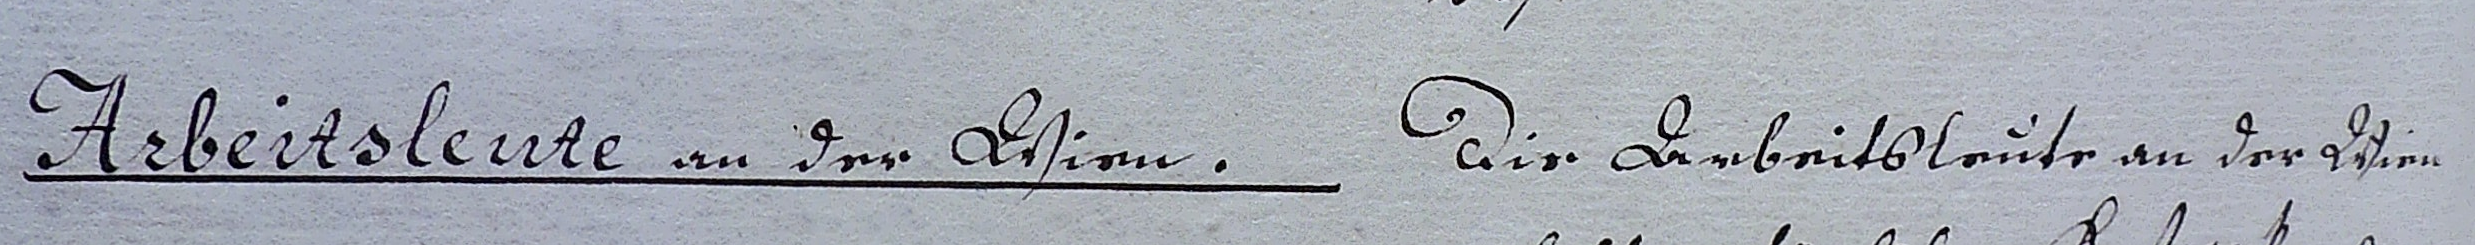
Arbeitsleute an der Wien. Die Arbeitsleute an der Wien
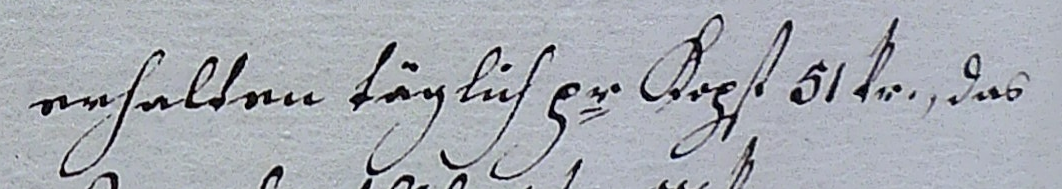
erhalten täglich pr͇ Kopf 51kr., das
